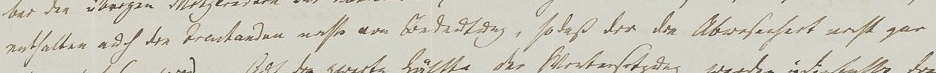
enthalten auch die Tractanden nichts von Bedeutung, so daß Dir die Abwesenheit nicht gar
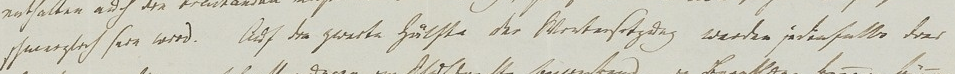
schmerzlich sein wird. Auf die zweite Hälfte der Wintersitzung werden jedenfalls drei
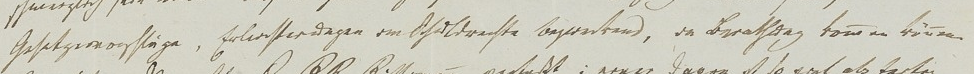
Gesetzesvorschläge, Erleichterungen im Schuldrechte bezweckend, in Berathung kommen können.
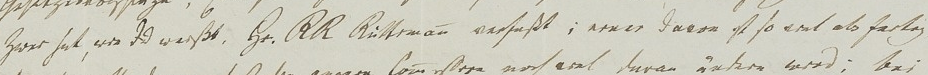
Zwei hat, wie Du weißt, Hr. RR Rüttimann verfaßt; einer davon ist so viel als fertig,
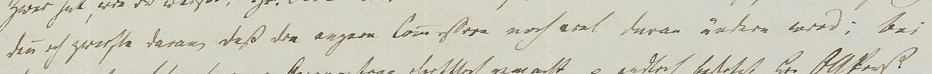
denn ich zweifle daran, daß die engere Commission noch viel daran ändern wird; bei
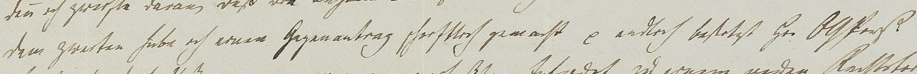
dem zweiten habe ich einen Gegenantrag schriftlich gemacht & endlich besitzt Hr. OGPres.
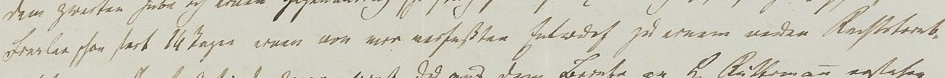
Finsler schon seit 14 Tagen einen von mir verfaßten Entwurf zu einem neuen Rechtstrieb-
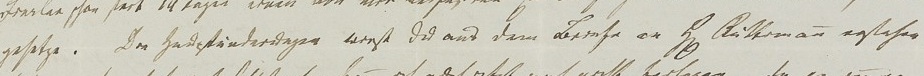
gesetze. Die Hauptänderungen wirst Du aus dem Briefe an Herrn Rüttimann ersehen
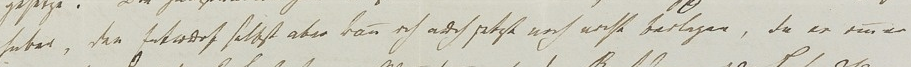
haben, den Entwurf selbst aber kann ich auch jetzt noch nicht beilegen, da er immer
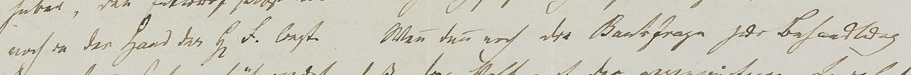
noch in der Hand des Herrn F. liegt. Wenn dann noch die Bankfrage zur Behandlung
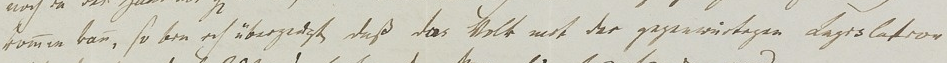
kommen kann, so bin ich überzeugt, daß das Volk mit der gegenwärtigen Legislation
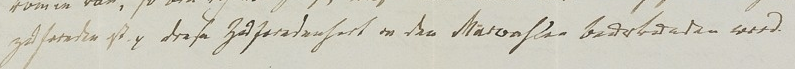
zurieden ist & diese Zufriedenheit in den Maiwahlen beurkunden wird.
